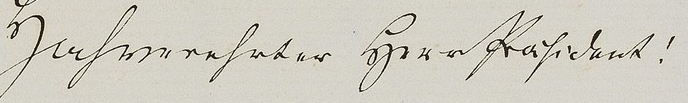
Hochverehrter Herr Präsident!
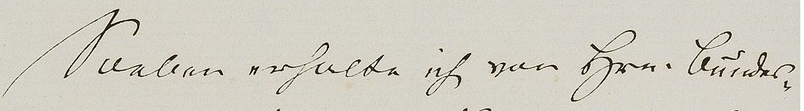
Soeben erhalte ich von Hrn. Bundes-
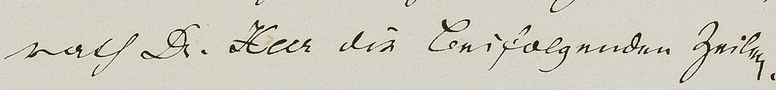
rath Dr. Heer die beifolgenden Zeilen.
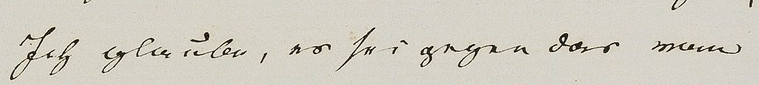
Ich glaube, es sei gegen das vom
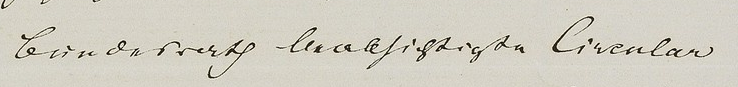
Bundesrath beabsichtigte Circular
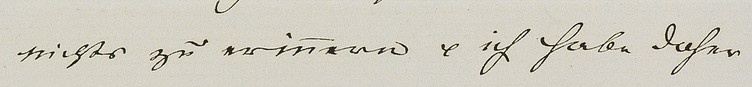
nichts zu erinnern & ich habe daher
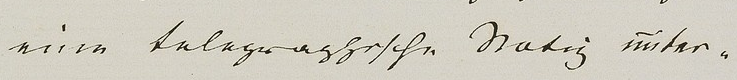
eine telegraphische Notiz unter-
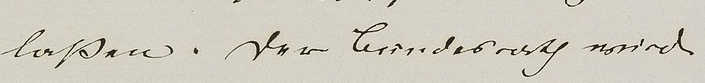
laßen. Der Bundesrath wird
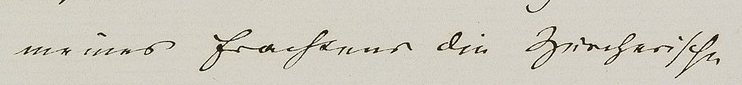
meines Erachtens die Zürcherischen
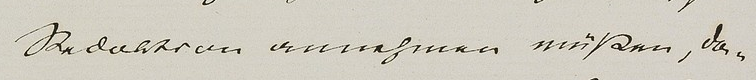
Redaktion annehmen müßen, da-
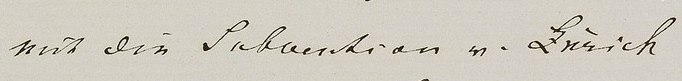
mit die Subvention v. Zürich
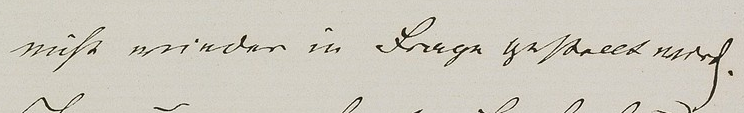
nicht wieder in Frage gestellt wird.
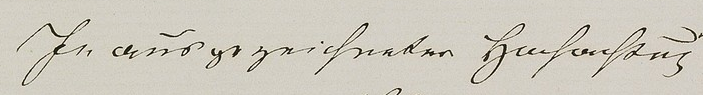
In ausgezeichneter Hochachtung
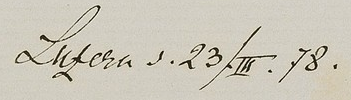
Luzern d. 23./III. 78.
